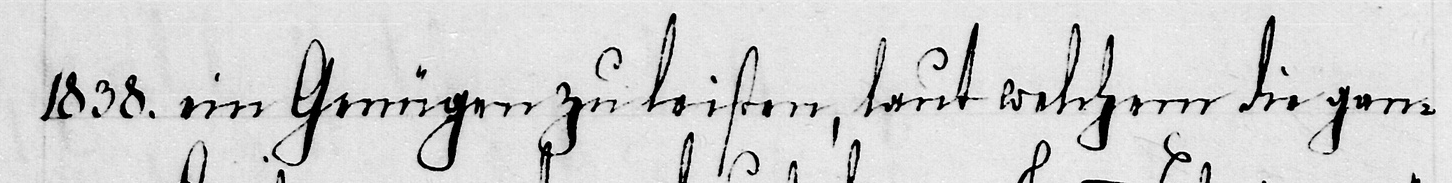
1838. ein Genüge zu leisten, laut welchem die gan¬
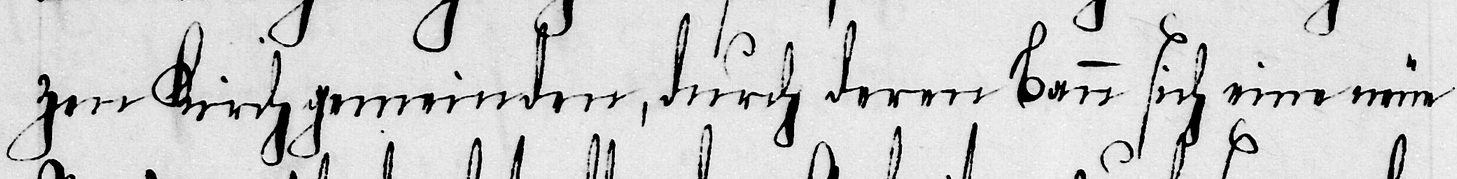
zen Kirchgemeinden, durch deren Bann sich eine neue
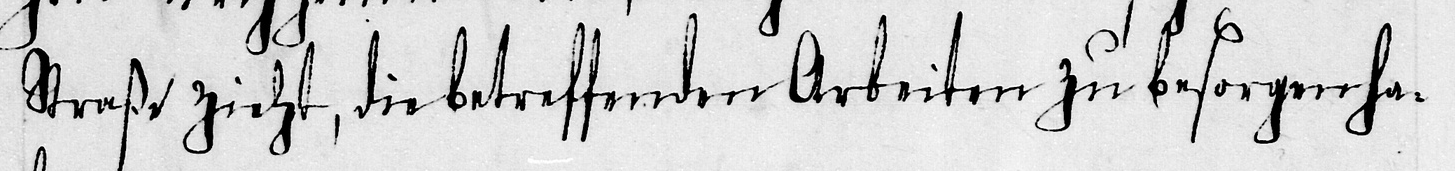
Straße zieht, die betreffenden Arbeiten zu besorgen ha¬
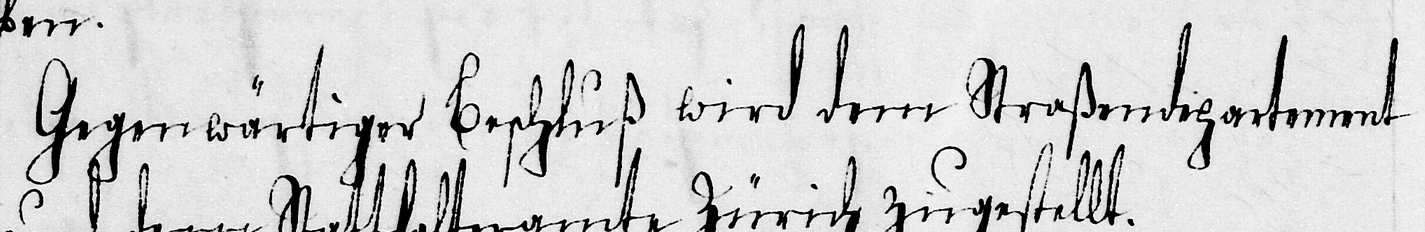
Gegenwärtiger Beschluß wird dem Straßendepartement
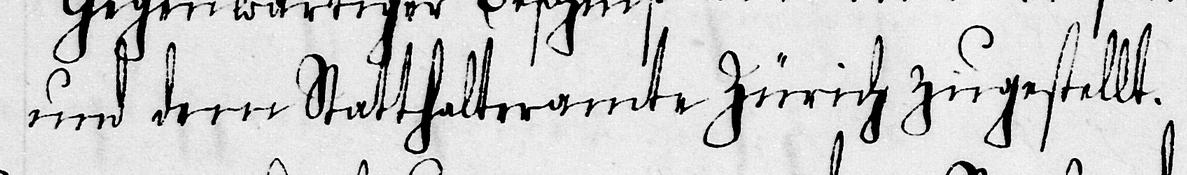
und dem Statthalteramte Zürich zugestellt.
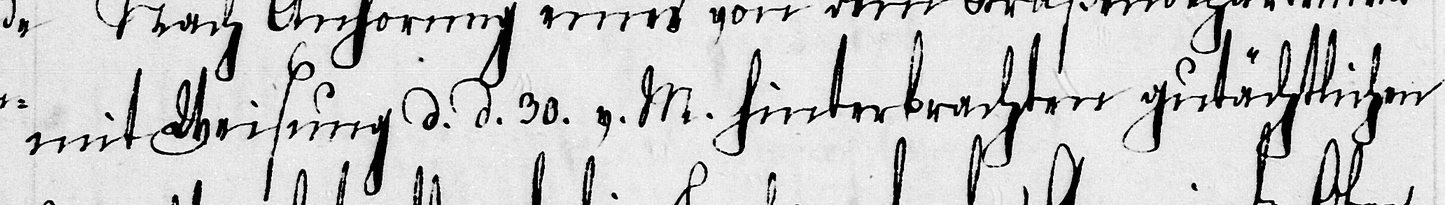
mit Weisung d. d. 30. v. M. hinterbrachten gutächtlichen
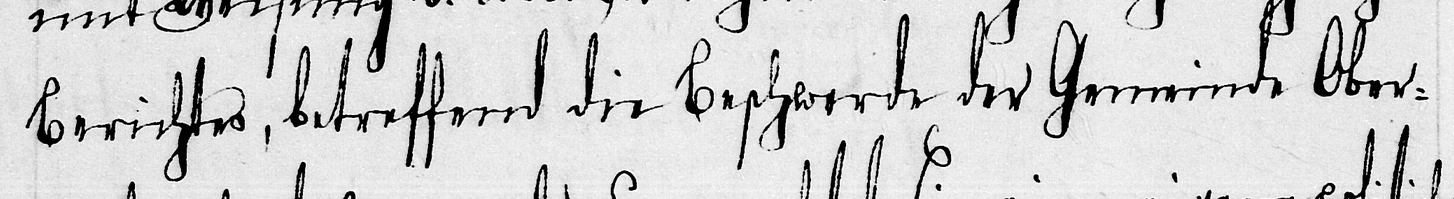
Berichtes, betreffend die Beschwerde der Gemeinde Obe¬
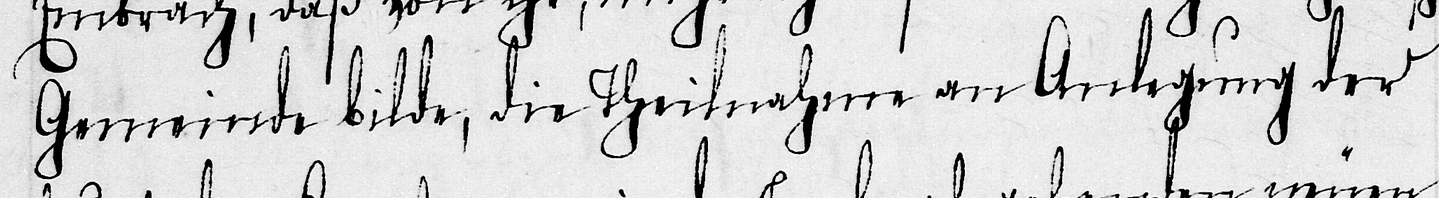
Gemeinde bilde, die Theilnahme an Anlegung einer
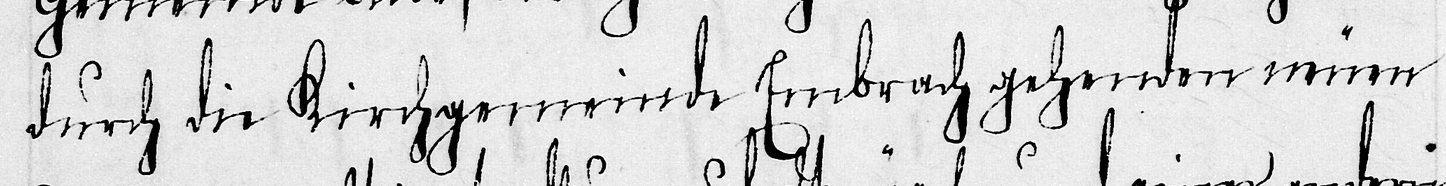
durch die Kirchgemeinde Embrach gehenden neuen
